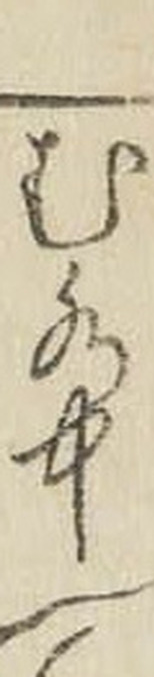む水中
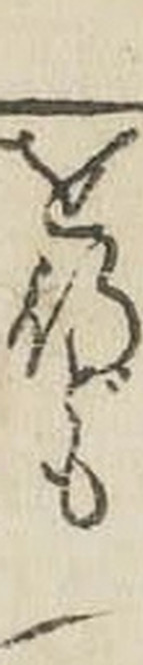を行ども
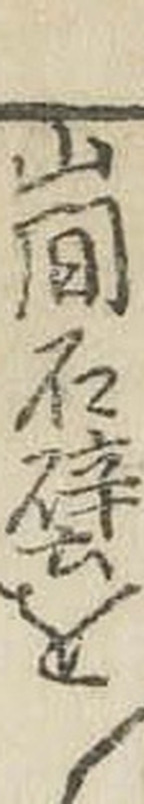山間石壁を
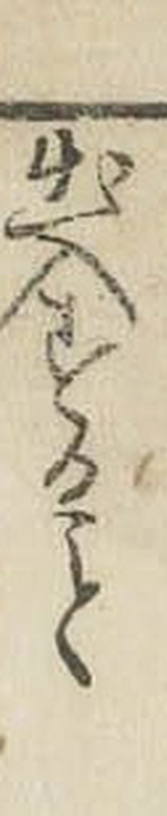出入すること
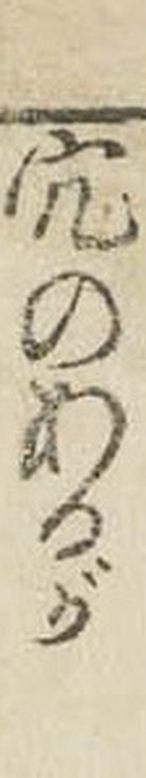穴のあるが
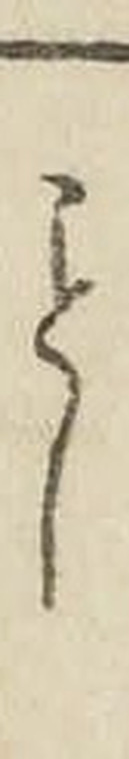ことし
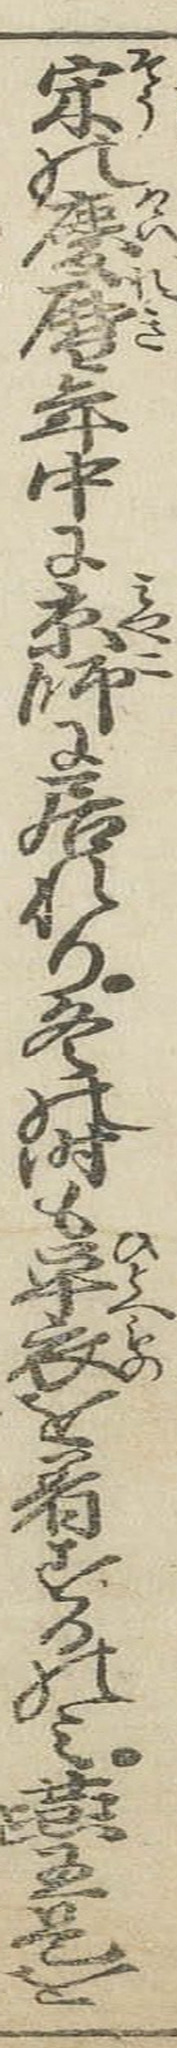宋の慶暦年中に京師に居れり。冬の時も単衣を着するのみ。燕五是を
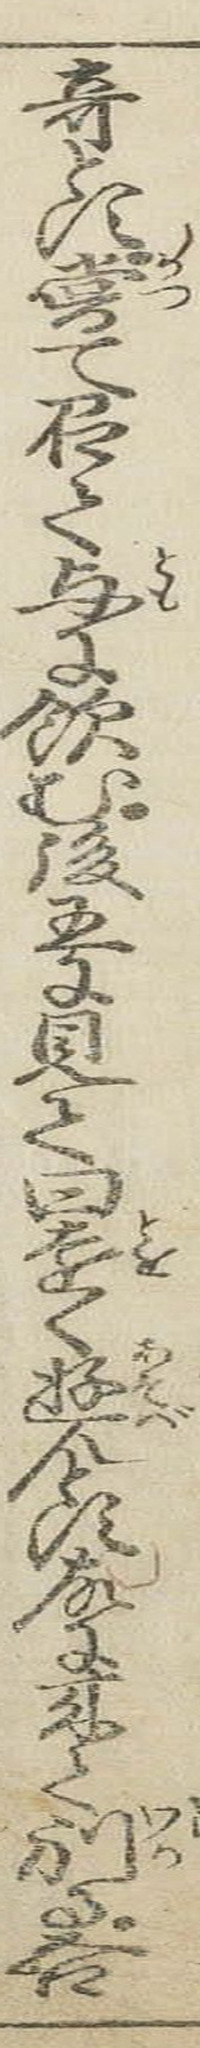奇とす嘗て召て与に飲む。後五に見て曰遠く遊んとす故に来て別る。吾
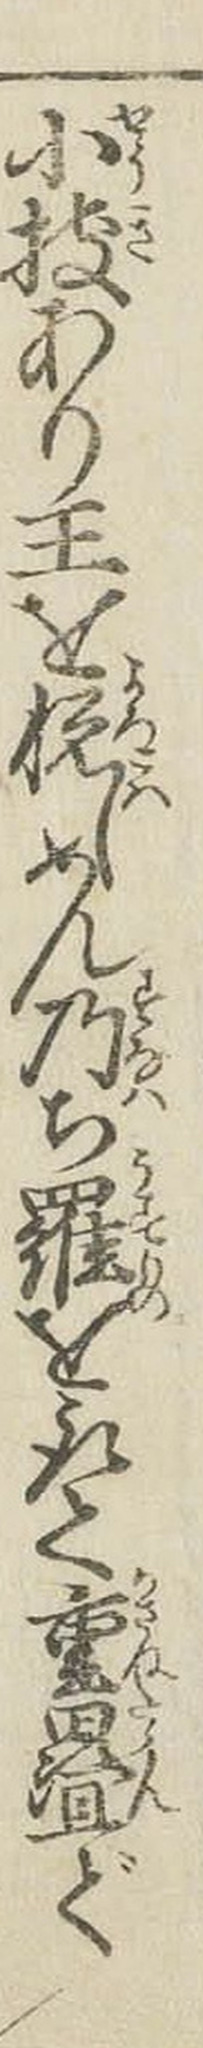小枝あり王を悦しめん乃ち羅を取て重畳で
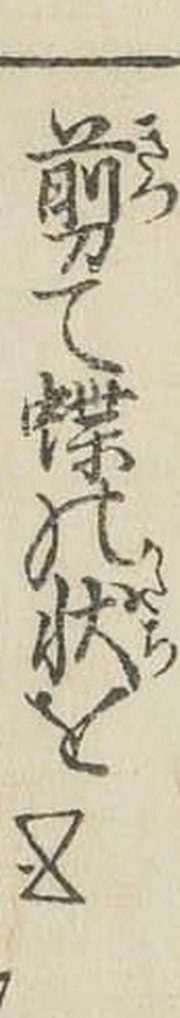剪て蝶の状を
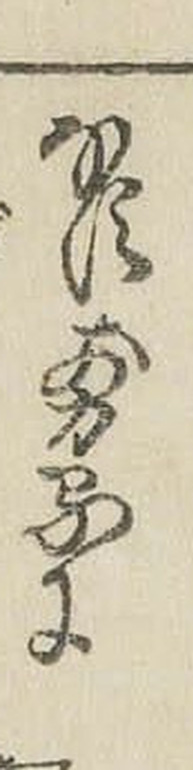なす剪るに
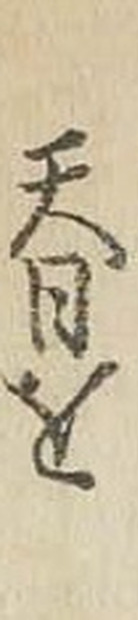天日を
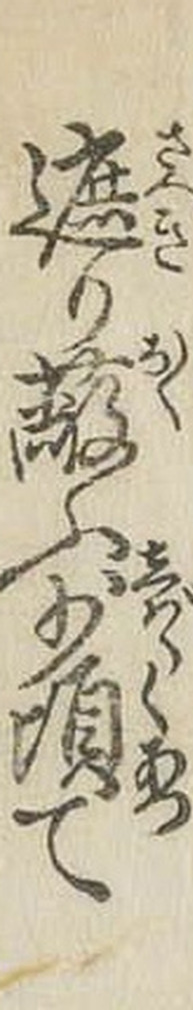遮り蔽ふ少頃て
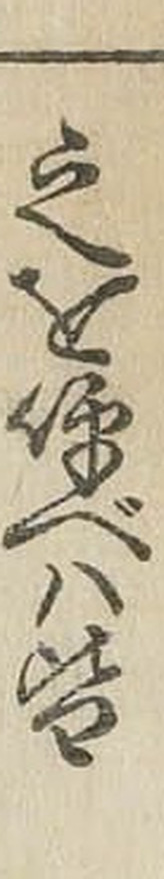之を呼べは皆
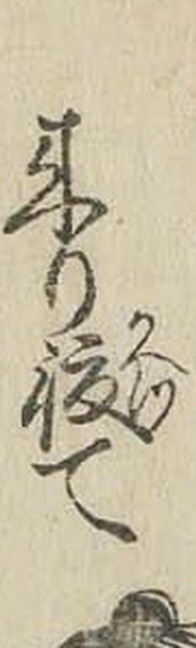来り復て
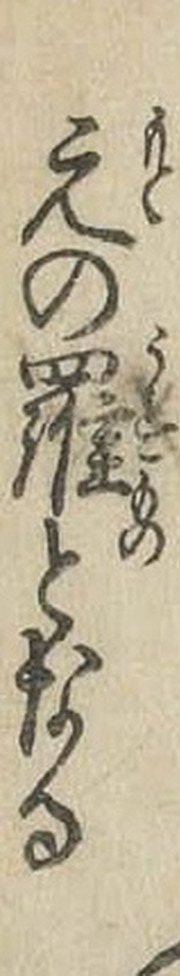元の羅となる
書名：絵本写宝袋 9巻 7之巻
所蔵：東京学芸大学教育コンテンツアーカイブ
